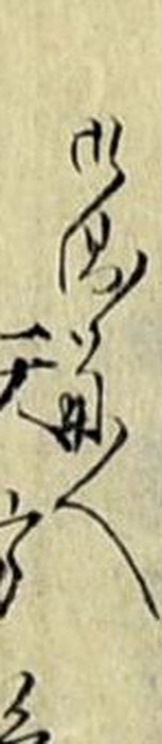御側御用人
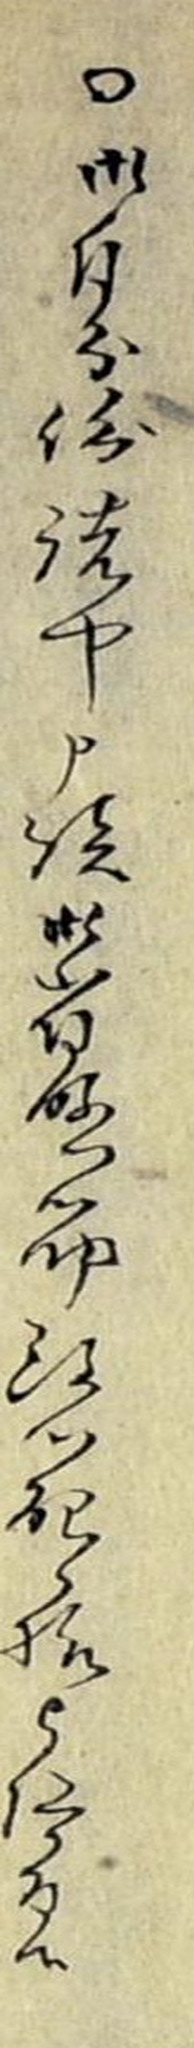○御自分儀詰中申談御省略筋致心配候様被仰付候
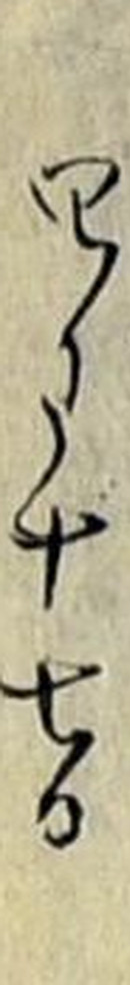四月十七日
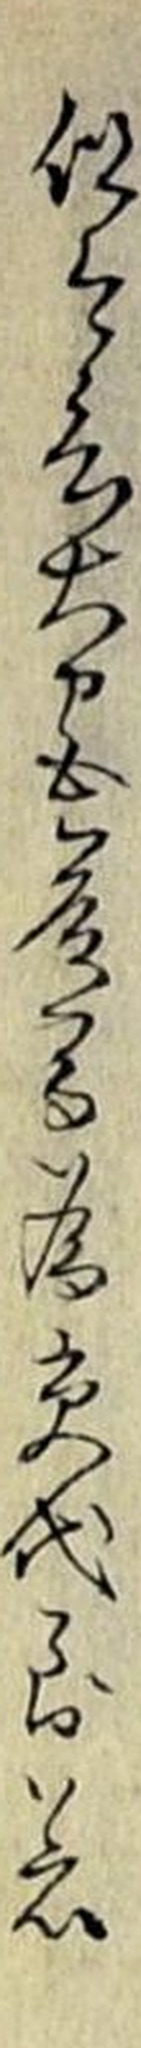但今度大宮藤馬為交代到着
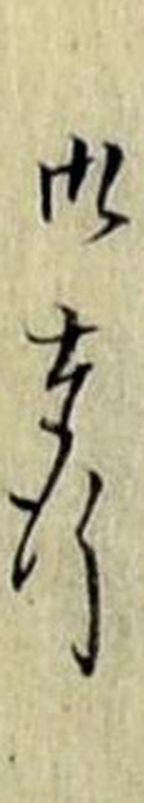御奉行
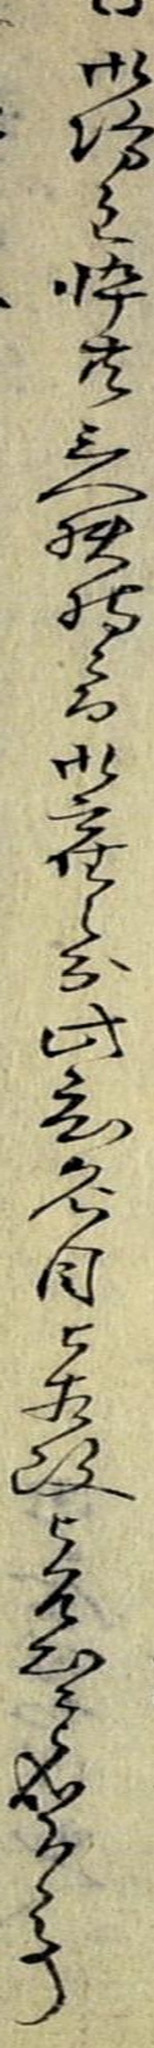○御坊主忰共三人扶持に而御雇之分此度名目被相改被召出に被成下候事
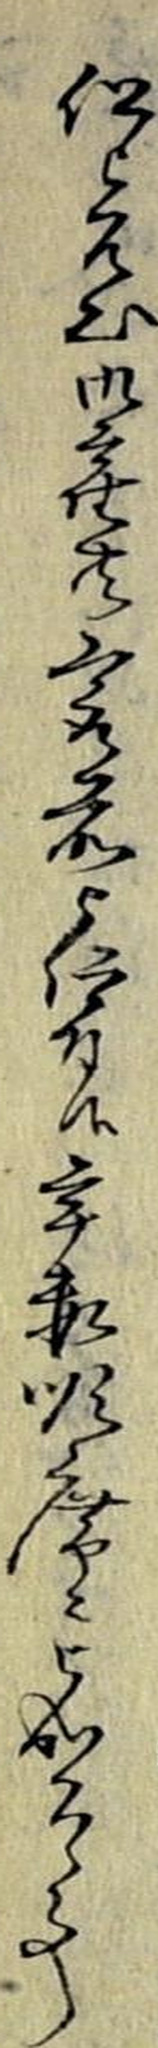但被召出御雇共最前被仰付候年数順席に被成下候事
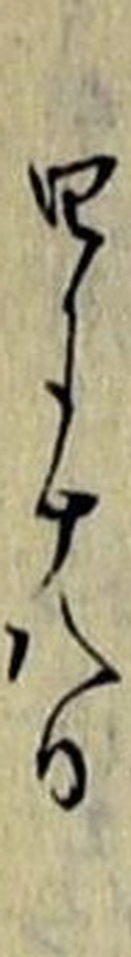四月十八日
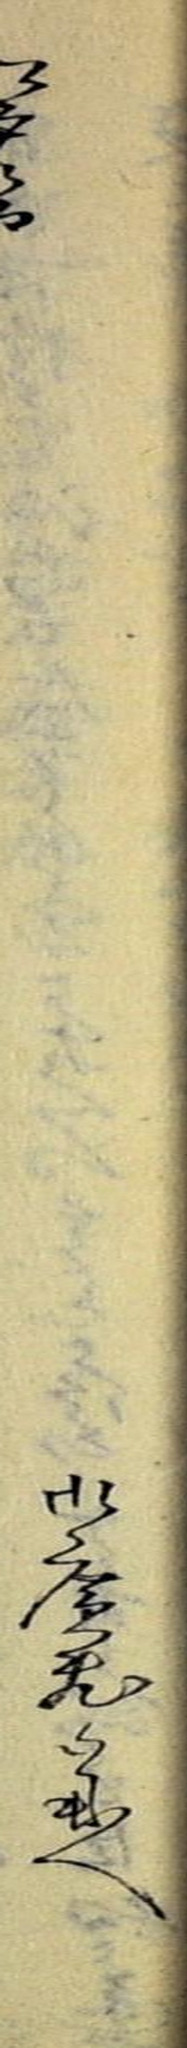江戸に而御広敷御用人
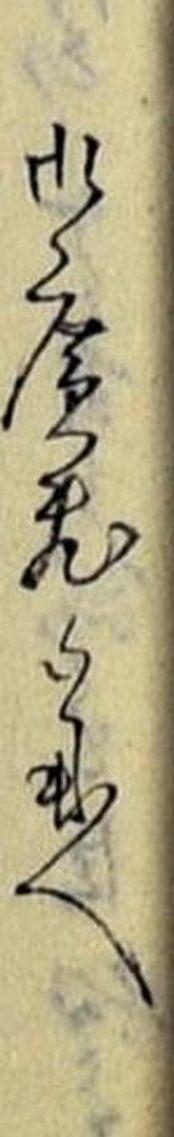御側御用人
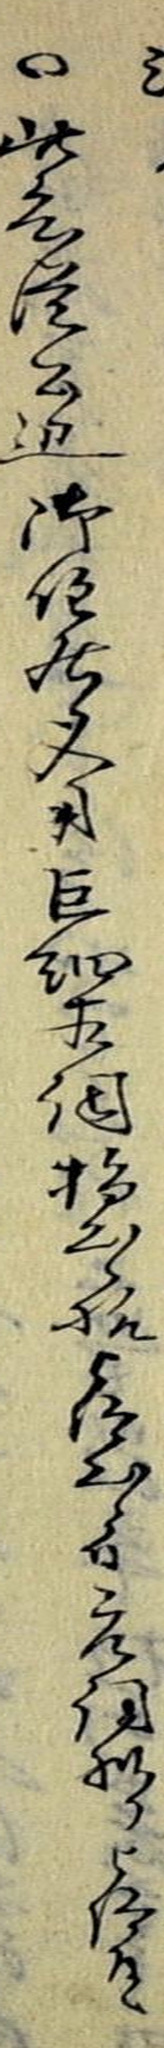○此度従公辺御住居御入用巨細相調指出候様被仰出候に付取調掛り被仰付候
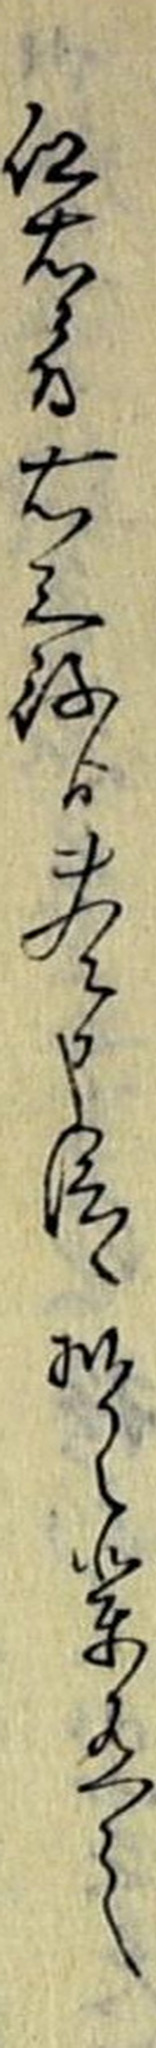但右に付右三役ゟ夫々申渡候掛り之輩有之
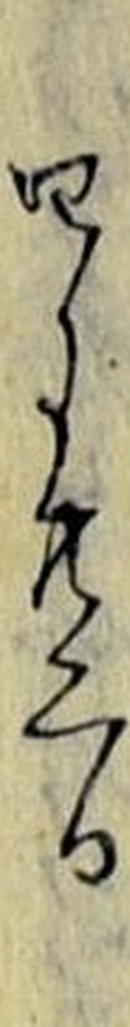四月廿二日
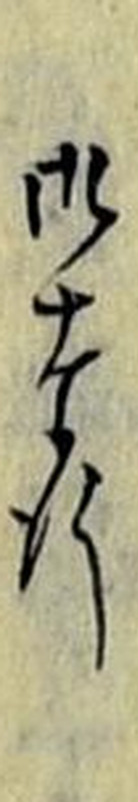御奉行
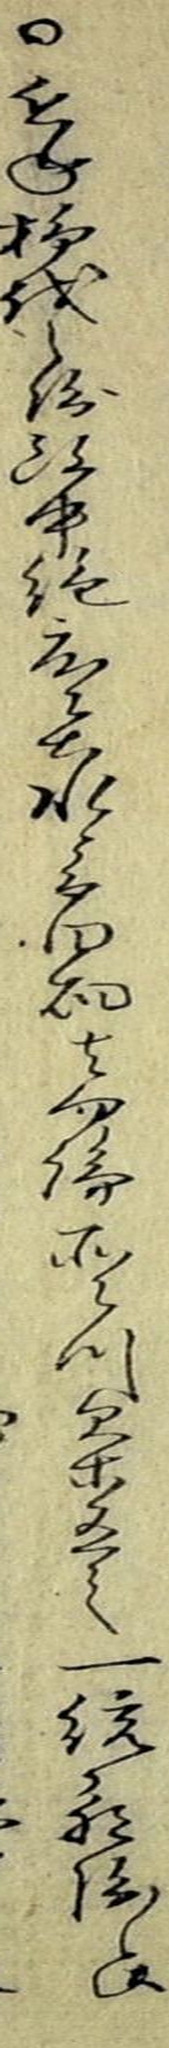○近年柳伐之儀致中絶度々出水に而田畑は勿論所々川欠等有之一統難儀之趣
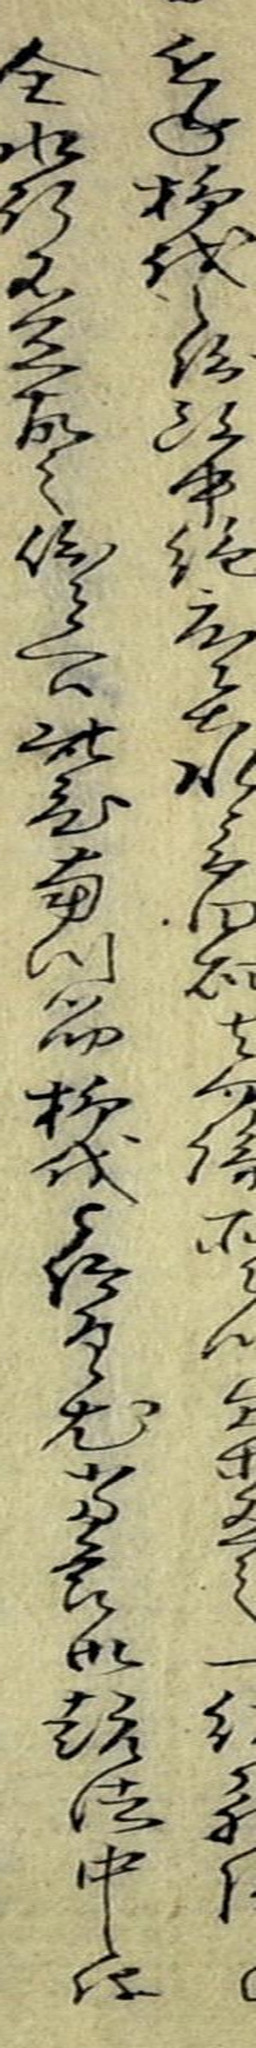全水行不宜故之儀に候へは此度南川筋柳伐被仰付候尤当節御趣法中之儀
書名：命令之部 六
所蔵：福井県文書館 Fukui Prefectural Archives
